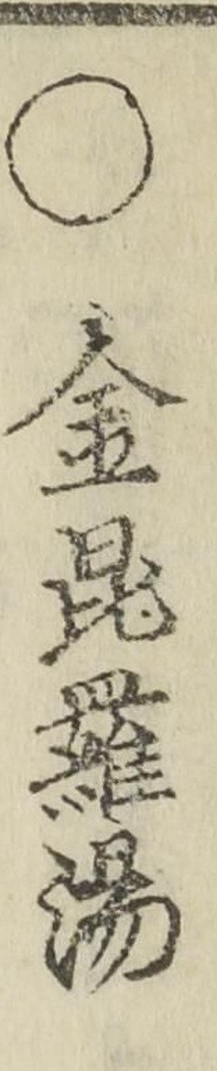〇金毘羅湯
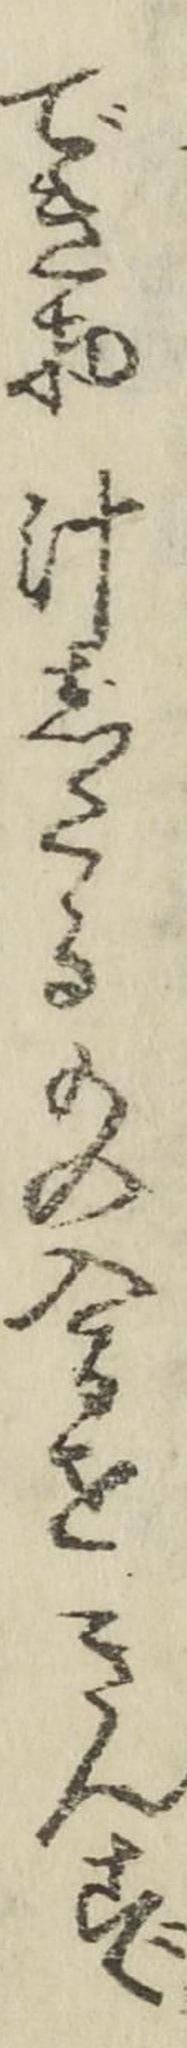でき物汁したゝるもの入るをきんず
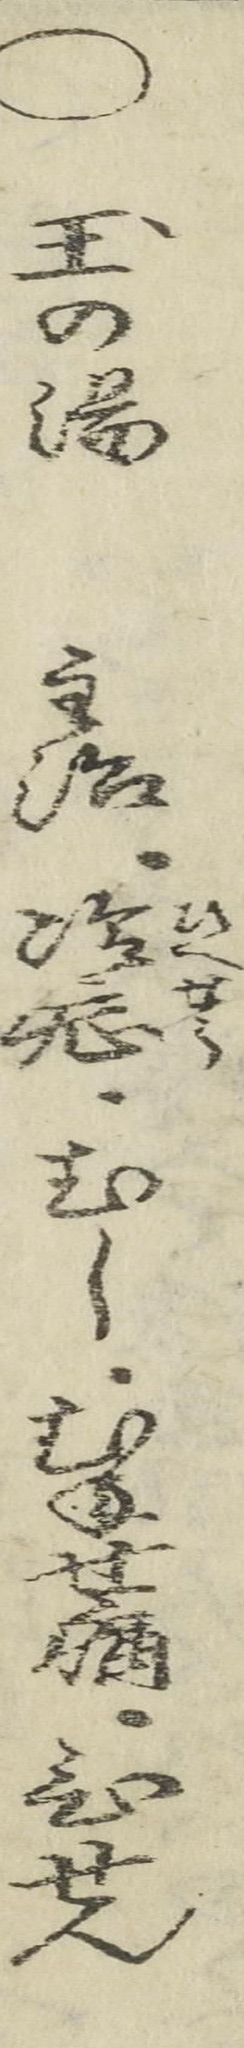〇玉の湯主治・冷症・むし・むねせ痛・ひせん
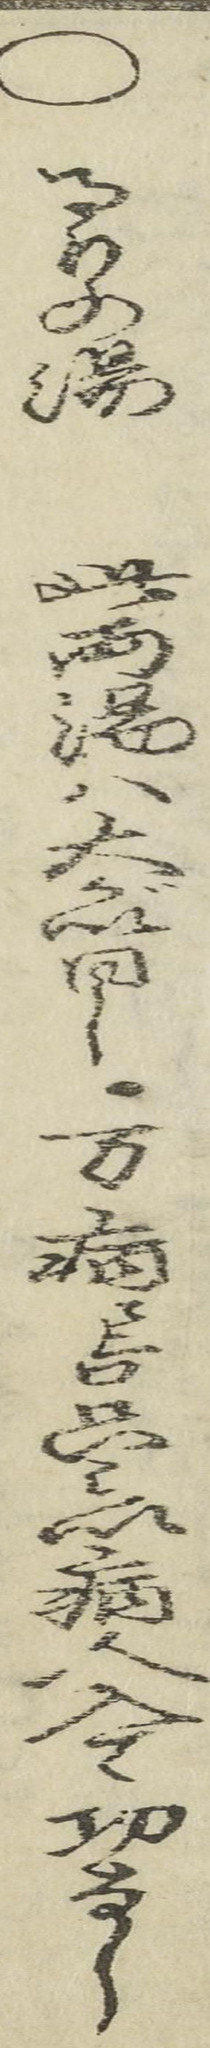〇るりの湯此両湯は大がい同し・万病に吉只し心病人入て功なし
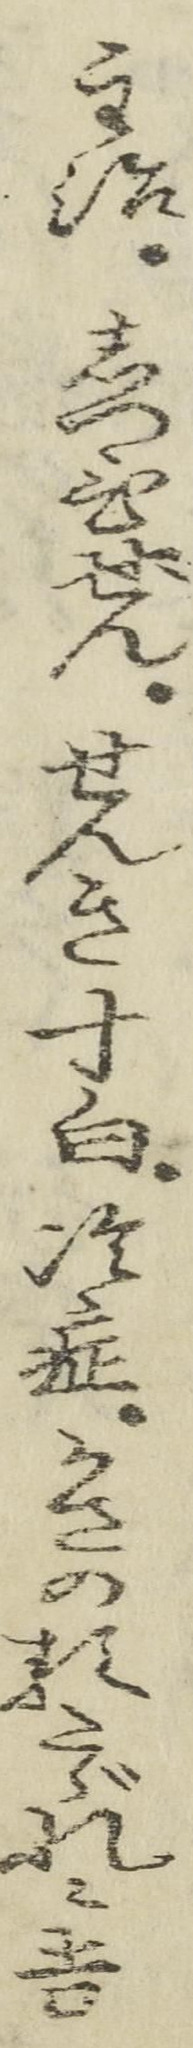〇白寿湯主治・しつひぜん・せんき寸白・冷症・かさの類たゞれに吉
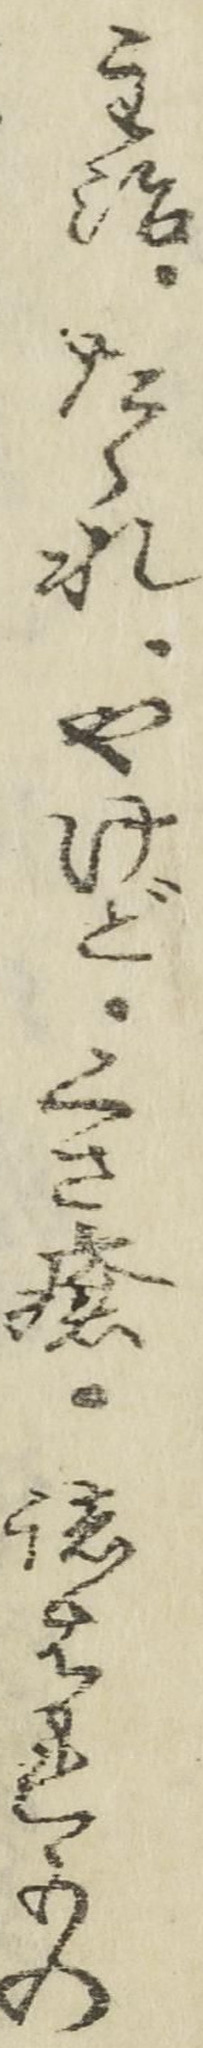主治・たゝれ・やけど・くさ瘡・諸はれもの
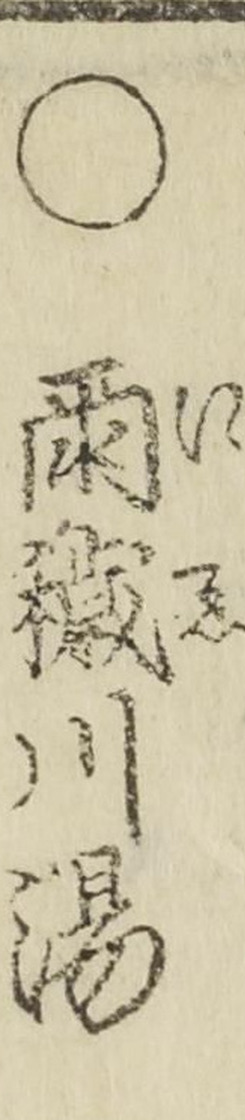〇爾穢川湯
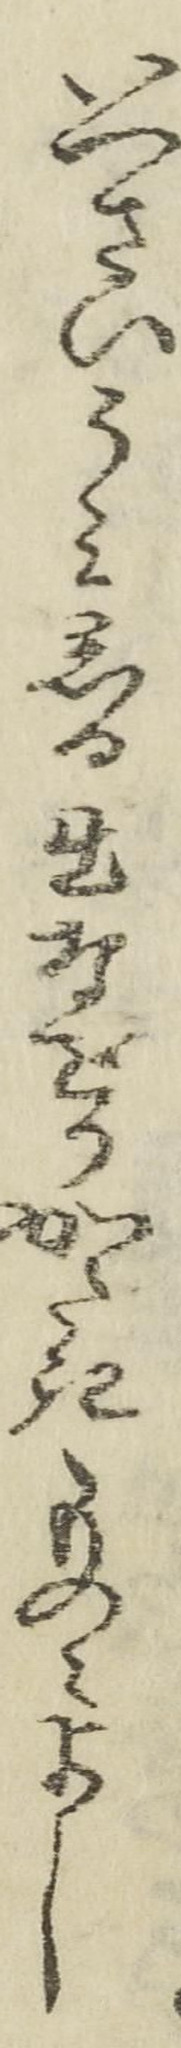いつさいうみしる出なをりかたきものによし
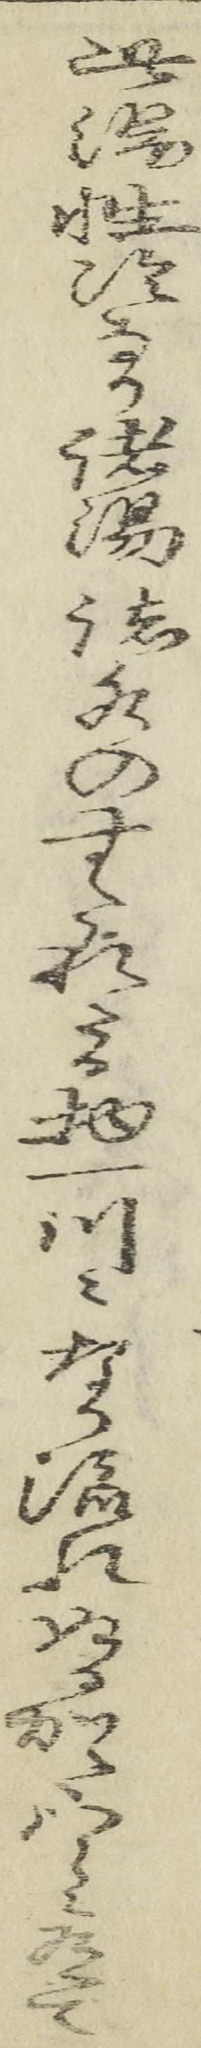此湯性冷なり諸湯諸水のすたれたる物一川になり流れぬるかたはらに有て
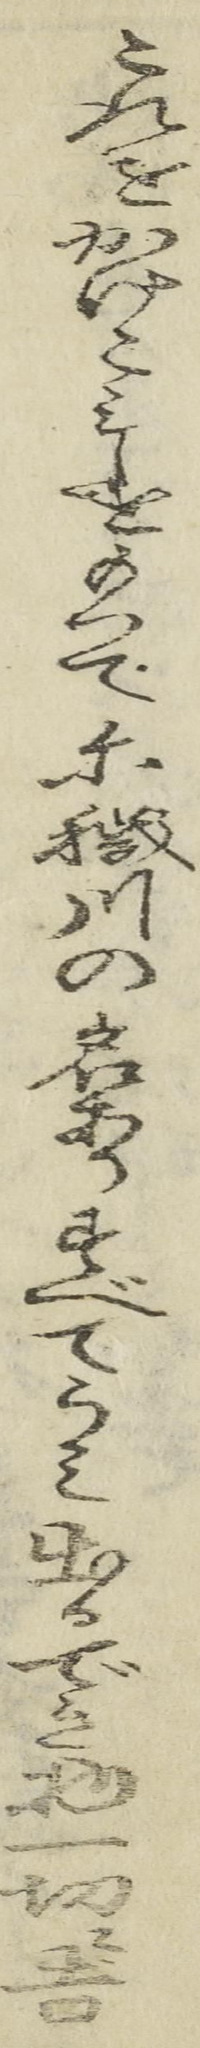これをかけこみしをもつて爾穢川の名ありすべてうみ出るでき物一切に吉
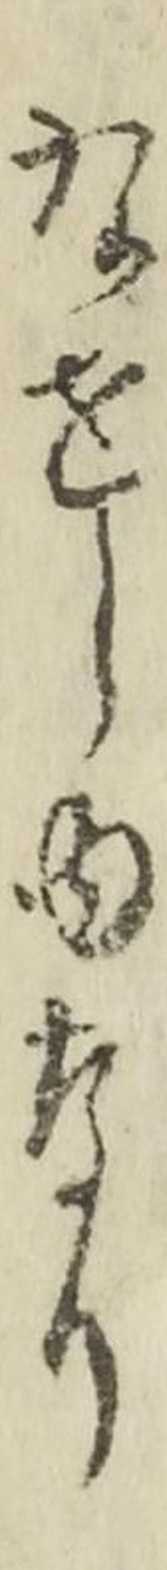なをし由なり
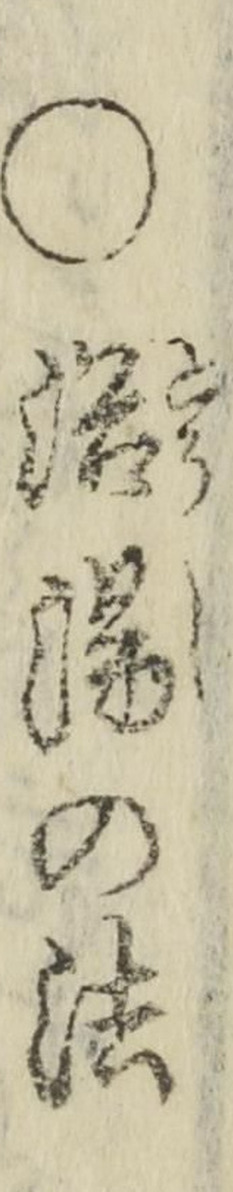〇治湯の法
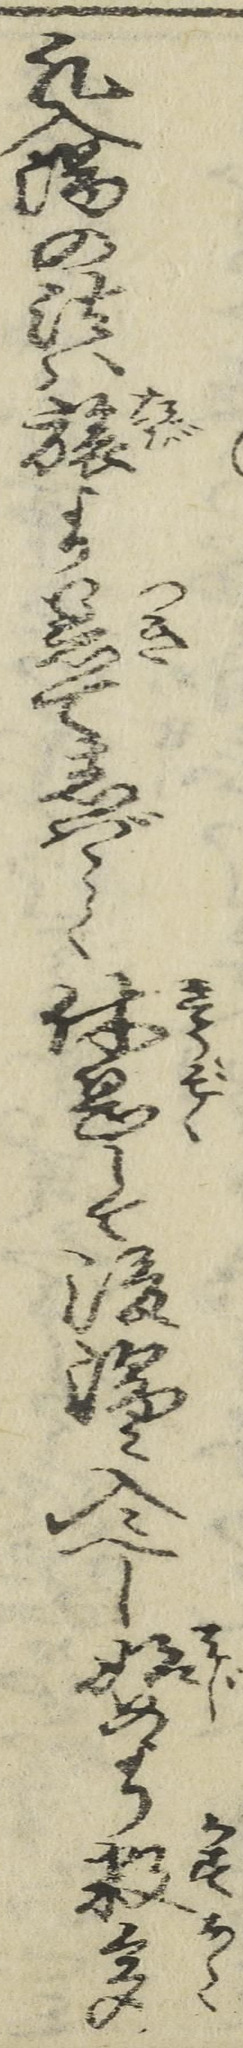凢入湯の法は旅より着てしばらく休息して後湯に入にへし始めより数多
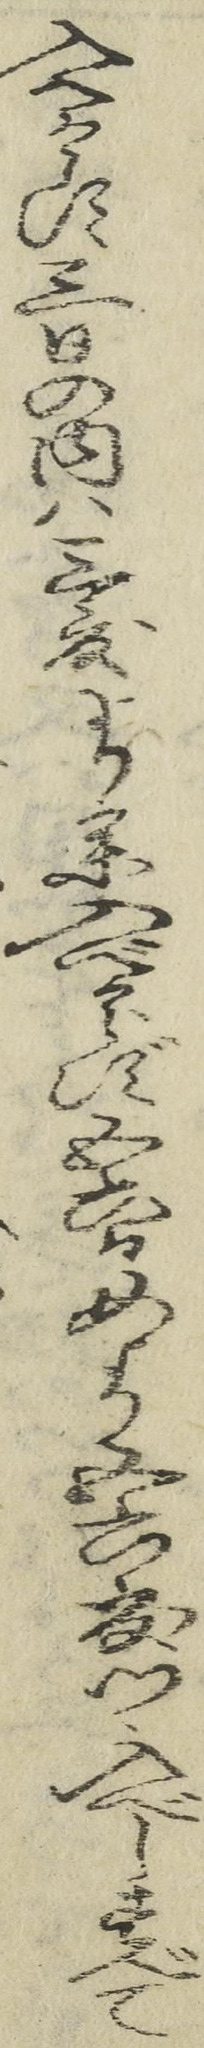入へからす三日の内は三度より薬？入べからず五六日めより五六度は入べしすべて
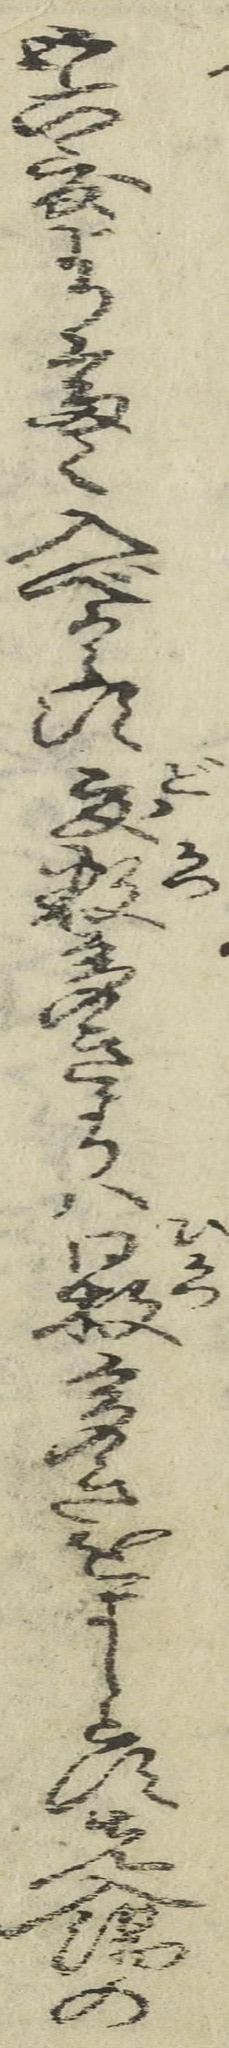五六度より多く入べからす度数多きよりは日数多きをよしとす先入湯の
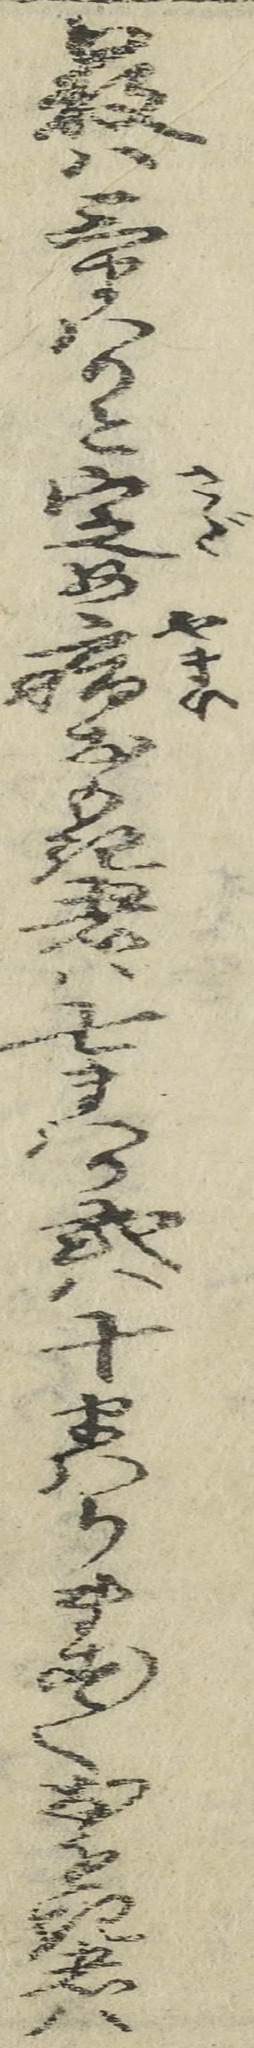日数は三まはりと定め病おもき者は七まわり或は十まはります〳〵おもき者は
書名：草津温泉　入湯案内記
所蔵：東京大学地震研究所図書室 Earthquake Research Institute Library, The University of Tokyo, JAPAN
